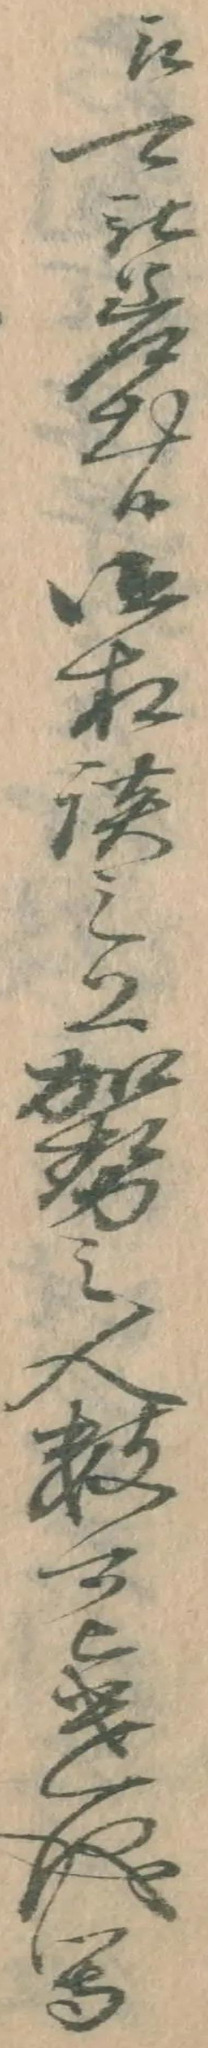江可被差出候御相談之上加勢之人数可被遣儀等
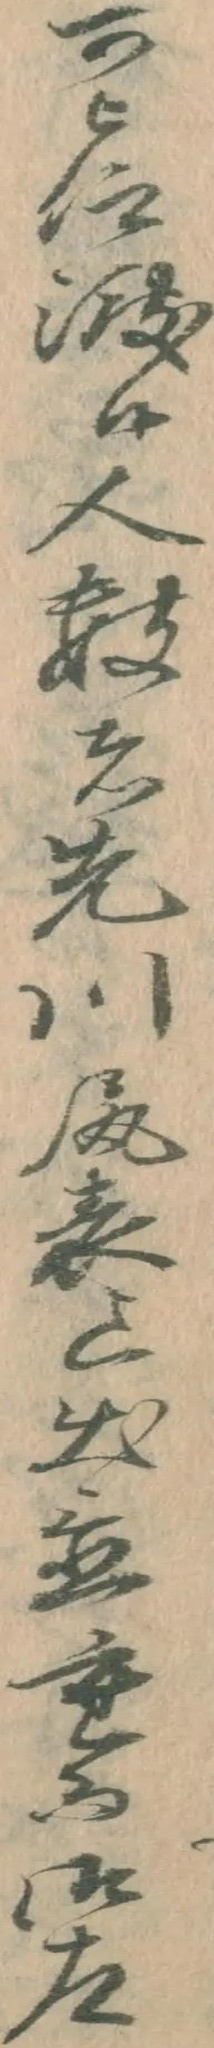可被仰渡候人数は先川尻表迄出置重而御左

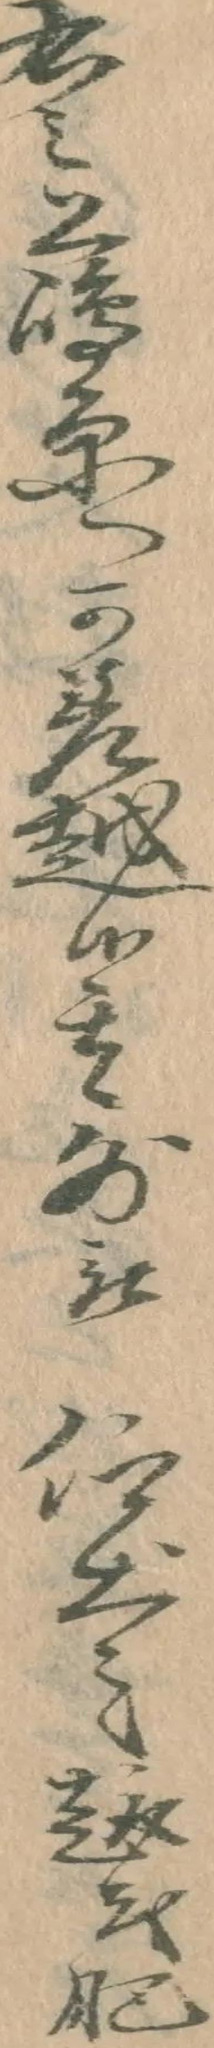右之上島原へ可差越候其外被仰出之趣も肥
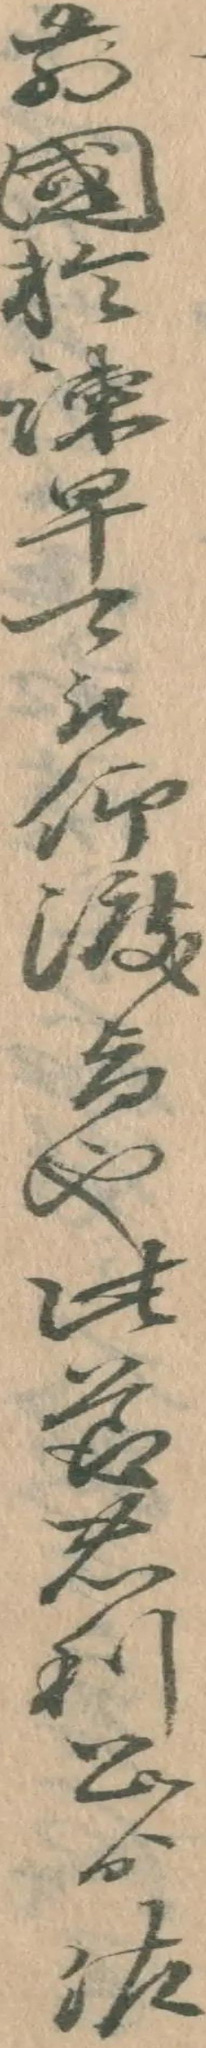前国於諫早可被仰渡旨也此節忠利公ゟ佐
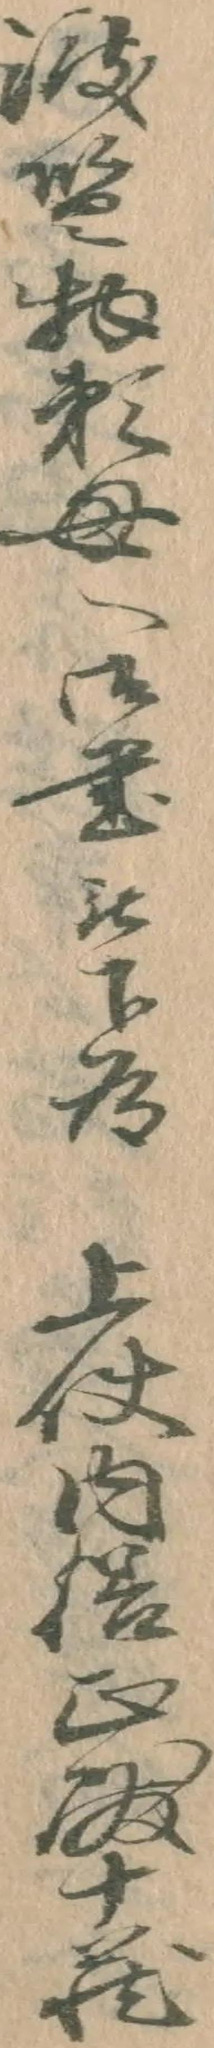渡監物頼母へ御書被下為上使内膳正殿十蔵
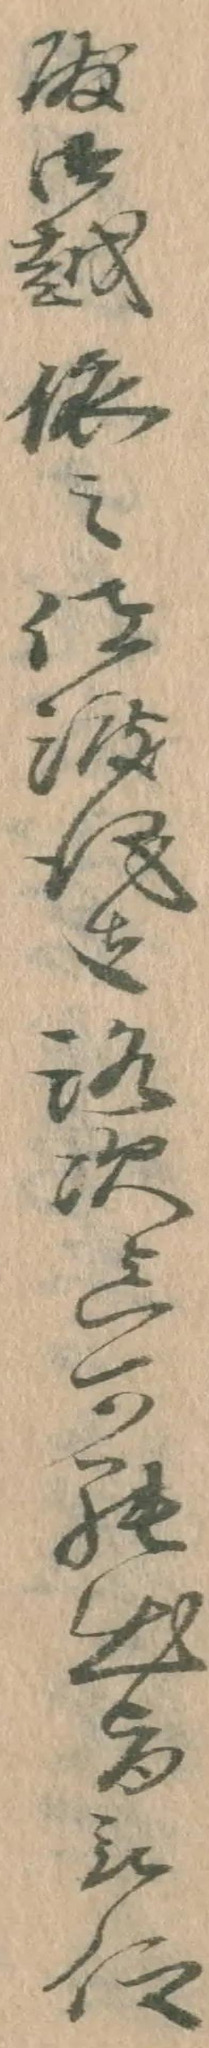殿御越依之佐渡儀は路次迄可罷出旨被仰
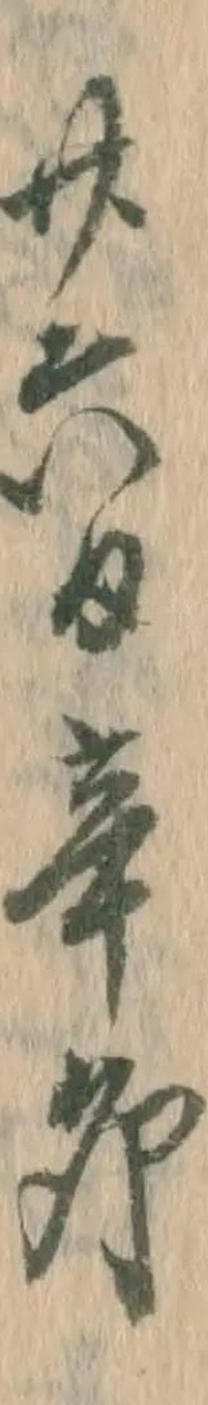廿六日辛卯
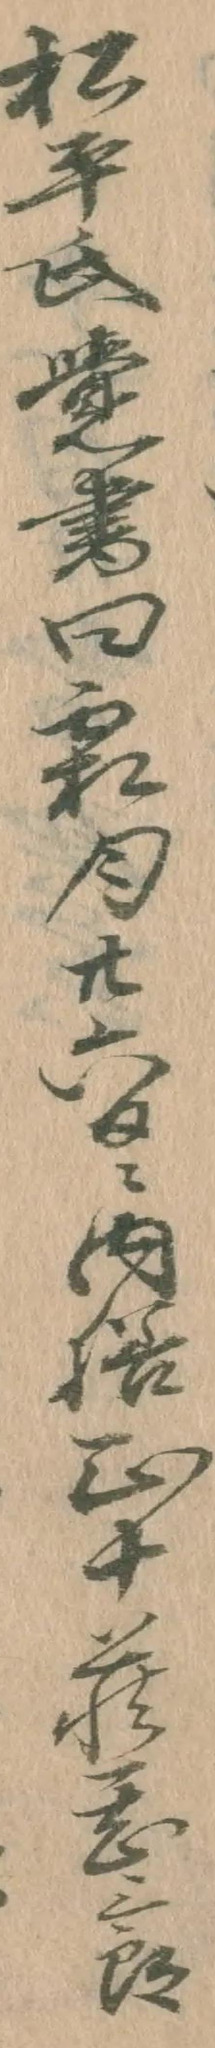松平氏覚書曰霜月廿六日に内膳正十蔵甚三郎
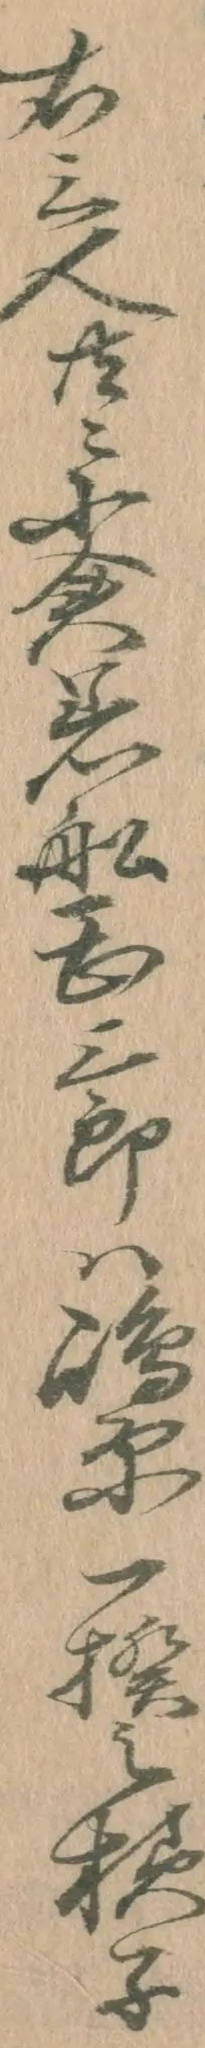右三人共に小倉着船甚三郎は島原一揆之様子
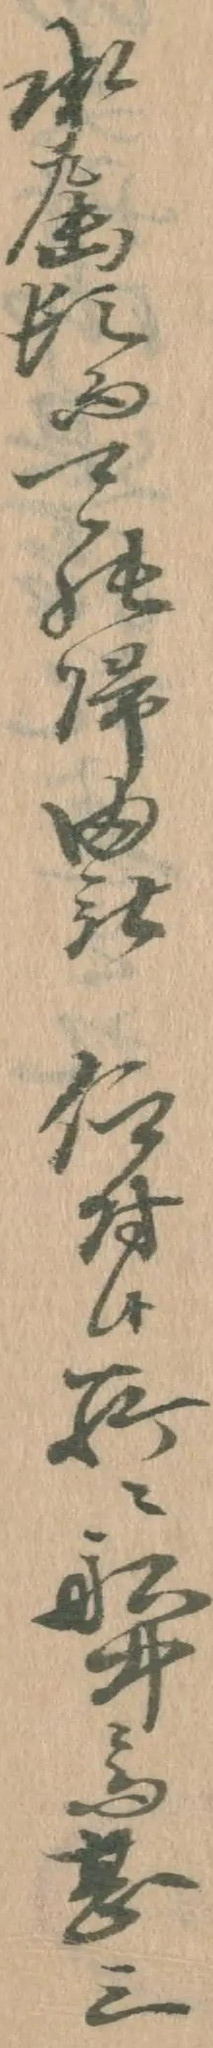承届頓而可罷帰由被仰付候所に船中に而甚三
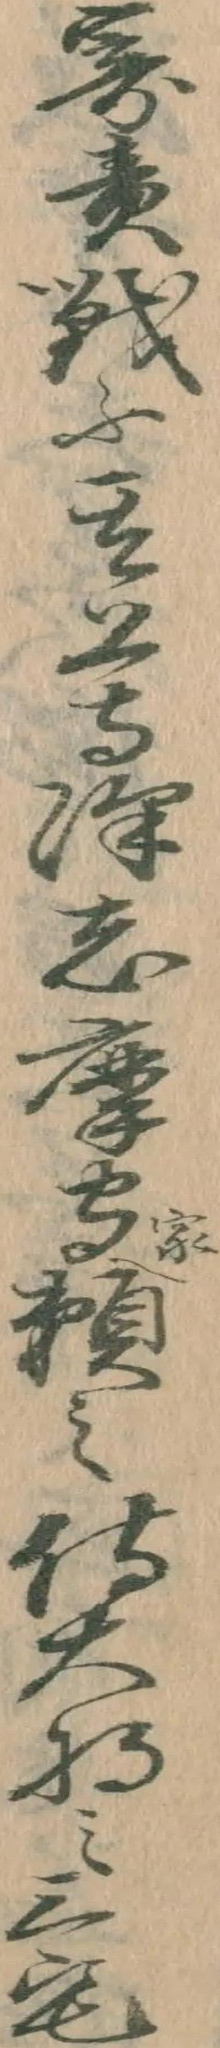寄責戦ふ其上寺沢志摩守頼之侍大将之三宅
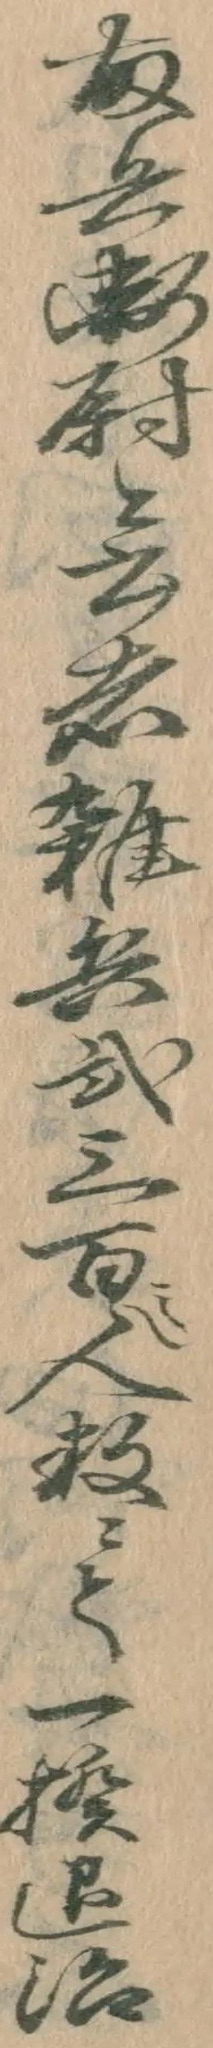藤兵衛尉と云者雑兵弐三百人数にて一揆退治
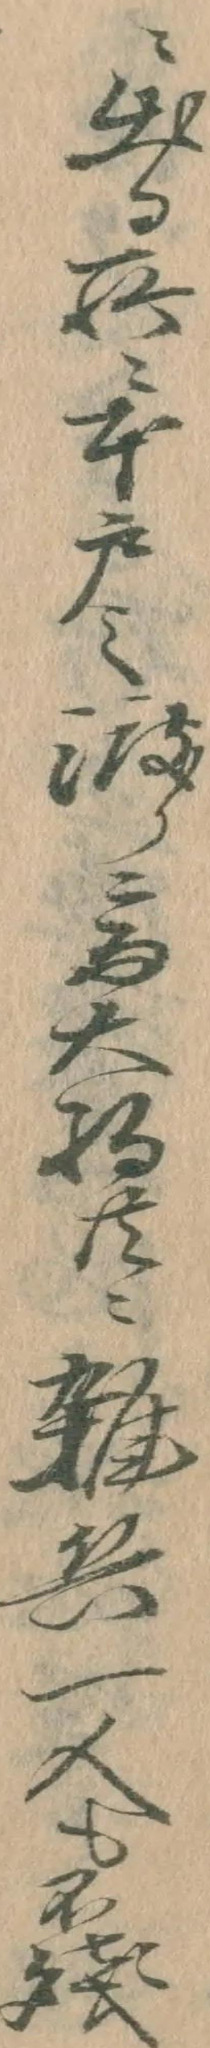に出る所に本戸之渡りに而大将共に雑兵一人も不残
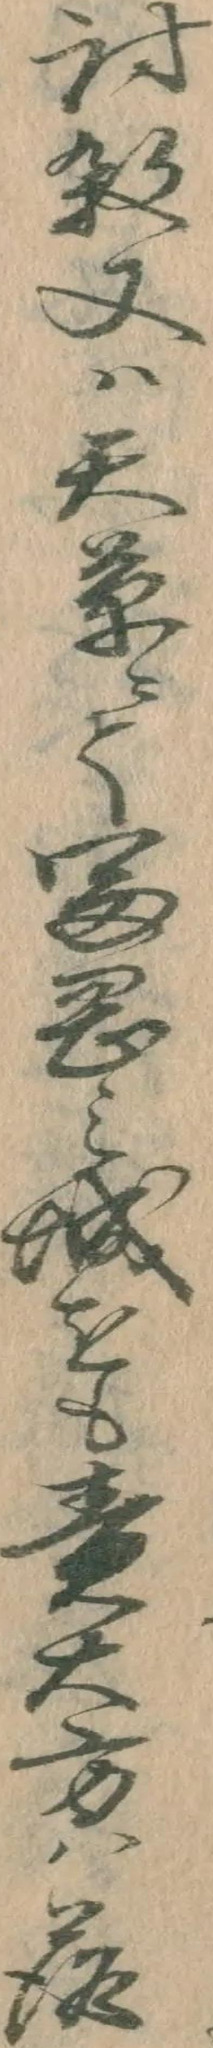討殺又は天草にて富岡之城をも責大方は落
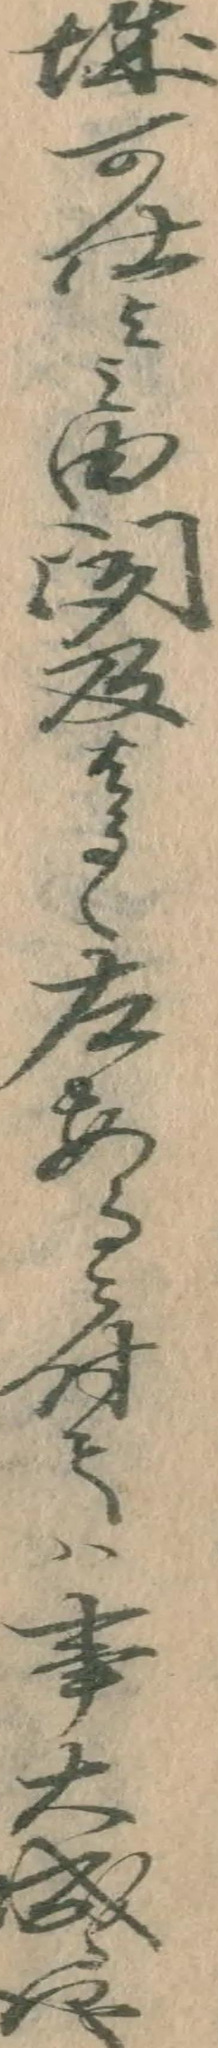城可仕と之由聞及はるゝ左あるに付ては事大成る儀
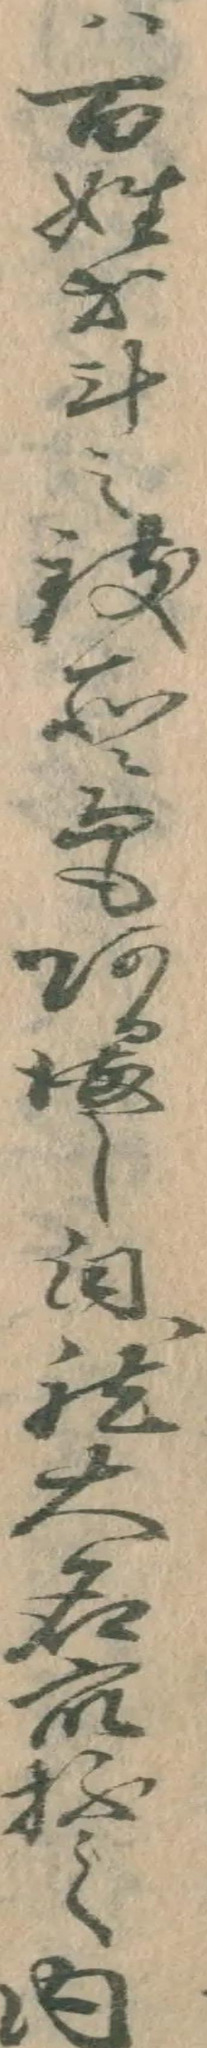は百姓等計之致所に而もあるまし自然大名衆抔之内
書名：切支丹御退治記 49巻. [3]
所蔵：国立国会図書館 National Diet Library, JAPAN
